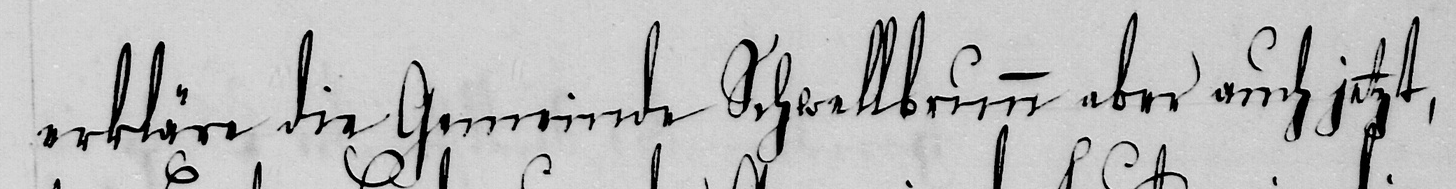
erkläre die Gemeinde Schwellbrunn aber auch jet¬
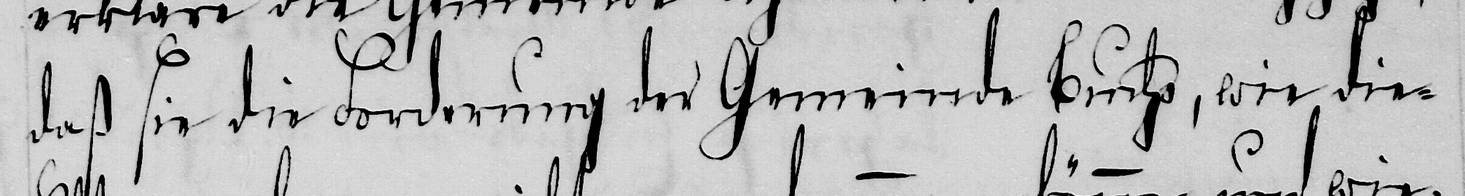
daß sie die Forderung der Gemeinde Buchs, wie die¬
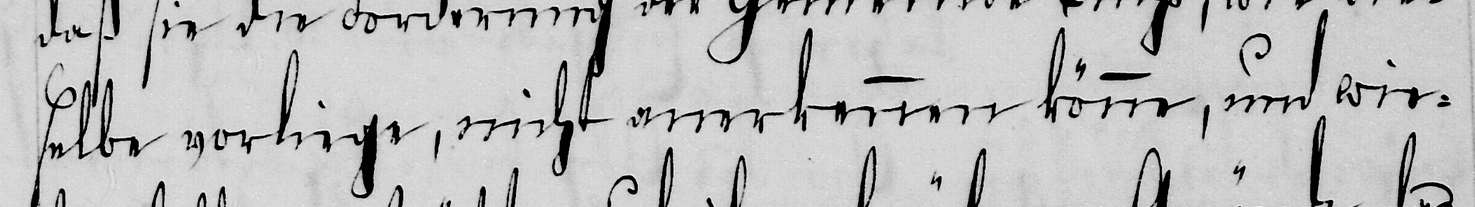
selbe vorliege, nicht anerkennen könne, und wie¬
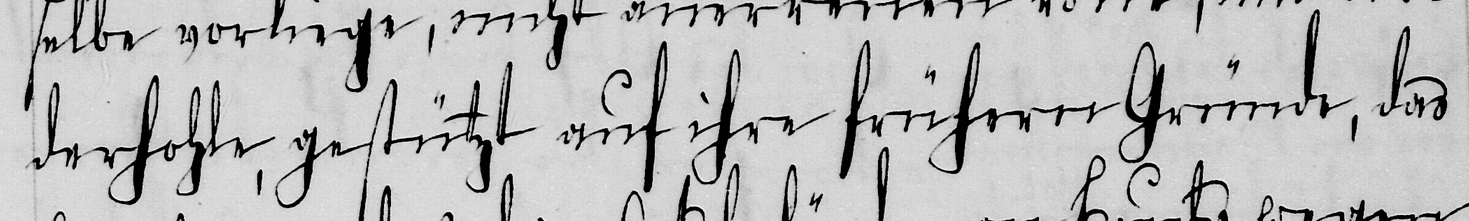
derhohle, gestützt auf ihre frühern Gründe, das
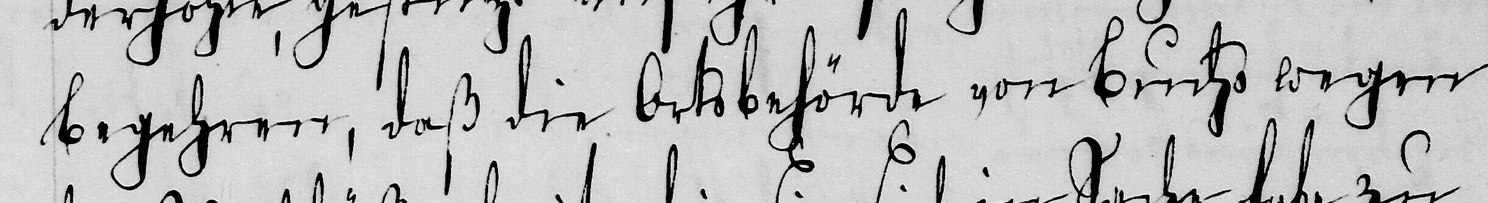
Begehren, daß die Ortsbehörde von Buchs wegen
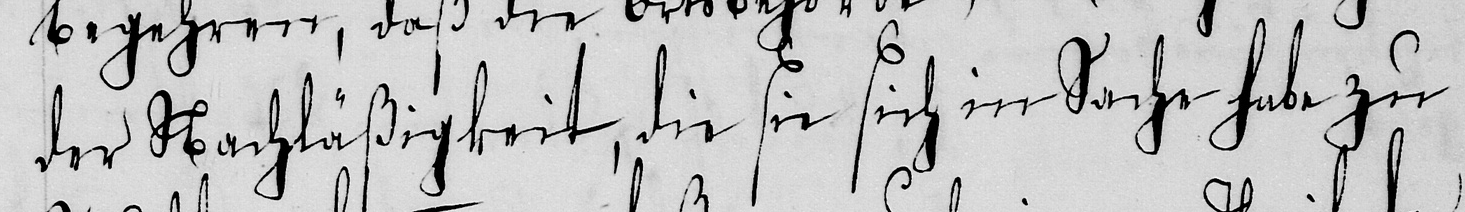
der Nachläßigkeit, die sie sich in Sache habe zu
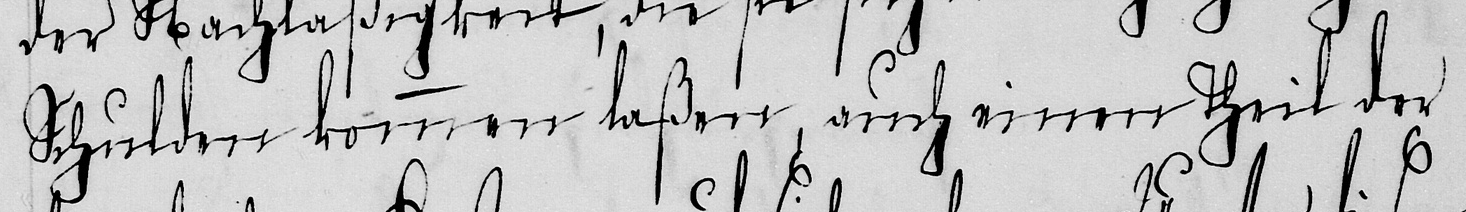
Schulden kommen laßen, auch einen Theil der
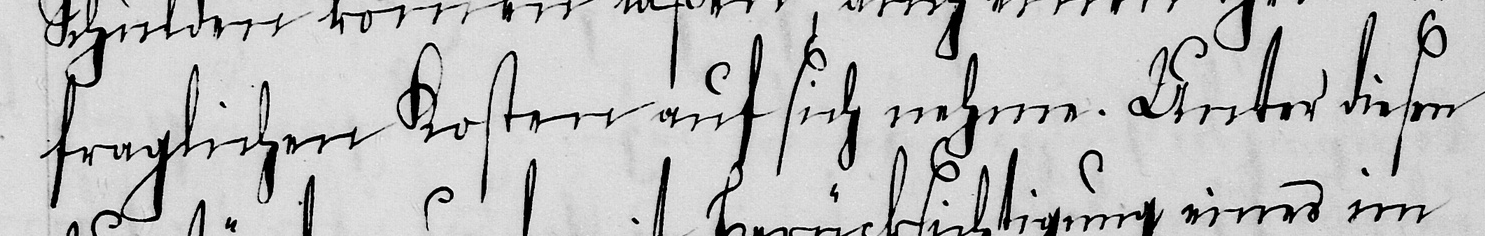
fraglichen Kosten auf sich nehme. Unter diesen
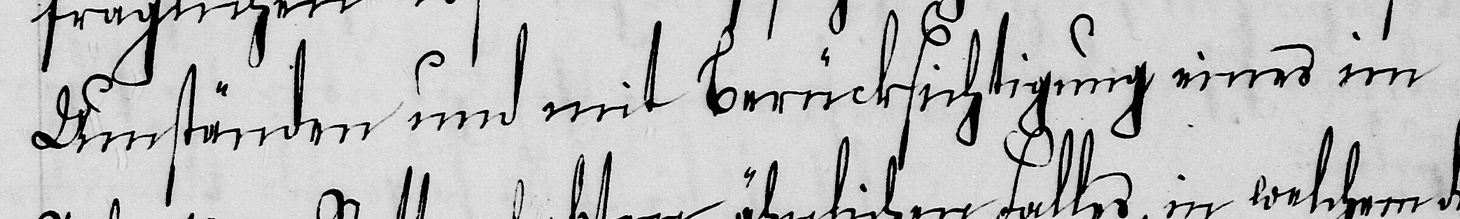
Umständen und mit Berücksichtigung eines im
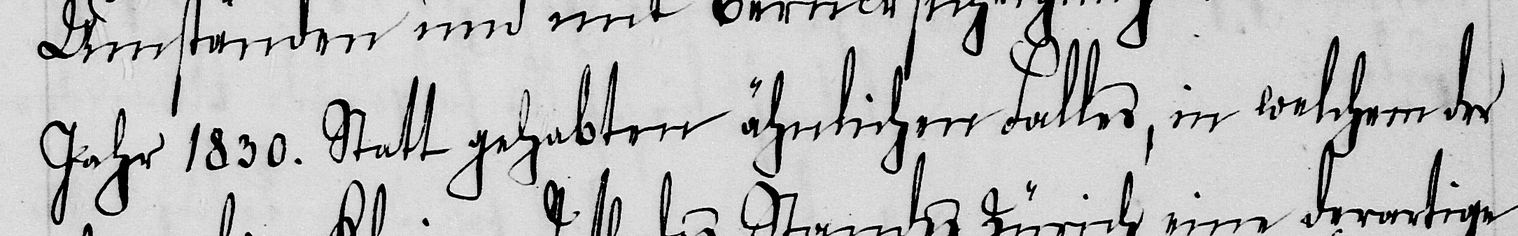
Jahr 1830. Statt gehabten ähnlichen Falles, in welchem der
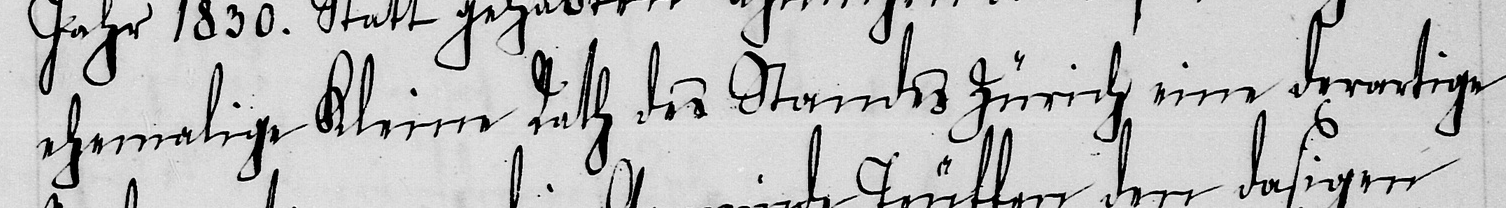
ehemalige Kleine Rath des Standes Zürich eine derartige
